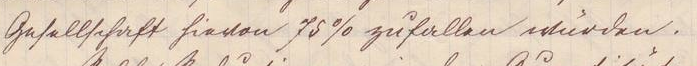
Gesellschaft hievon 75% zufallen würden.
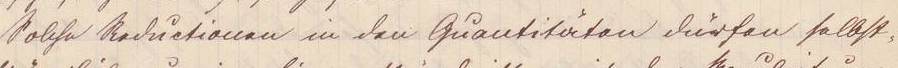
Solche Reductionen in den Quantitäten dürfen selbst-
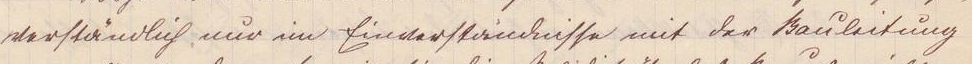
verständlich nur im Einverständnisse mit der Bauleitung
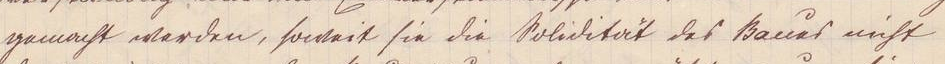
gemacht werden, soweit sie die Solidität des Baues nicht
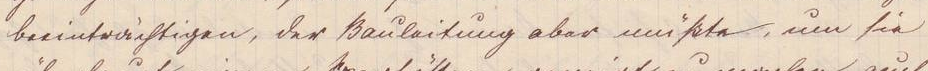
beeinträchtigen, der Bauleitung aber müßte, um sie
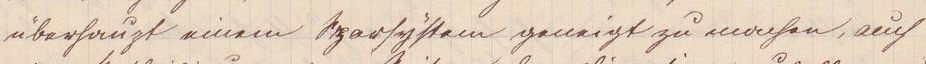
überhaupt einem Sparsystem geneigt zu machen, auch
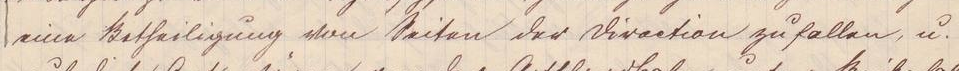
eine Betheiligung von Seiten der Direction zu fallen, u.
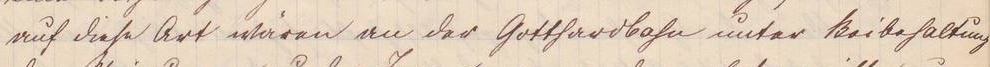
auf diese Art wären an der Gotthardbahn unter Beibehaltung
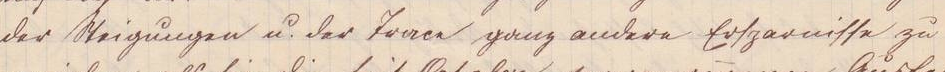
der Steigungen u. der Trace ganz andere Ersparnisse zu
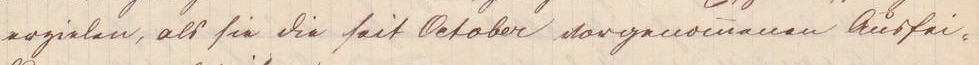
erzielen, als sie die seit October vorgenommenen Ausfei-
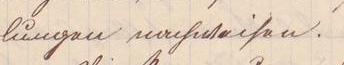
lungen nachweisen.
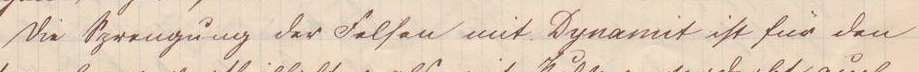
Die Sprengung der Felsen mit Dynamit ist für den
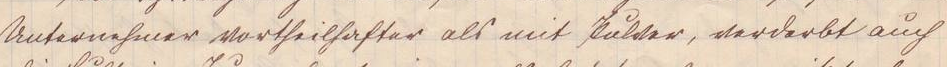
Unternehmer vortheilhafter als mit Pulver, verderbt auch
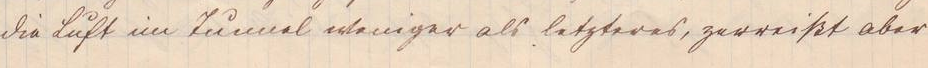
die Luft im Tunnel weniger als letzteres, zerreißt aber
